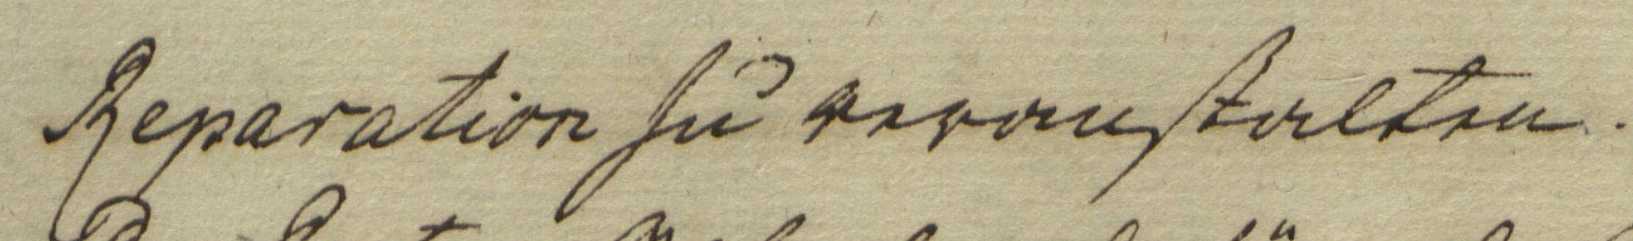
Reparation zu veranstalten.
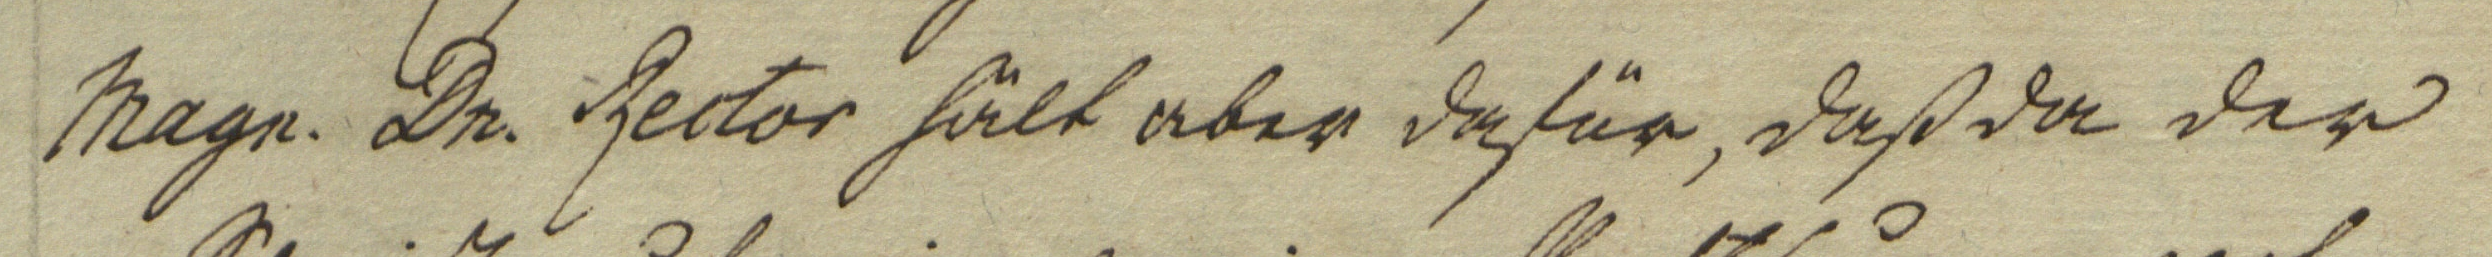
Magn. Dn. Rector hält aber dafür, daß da der
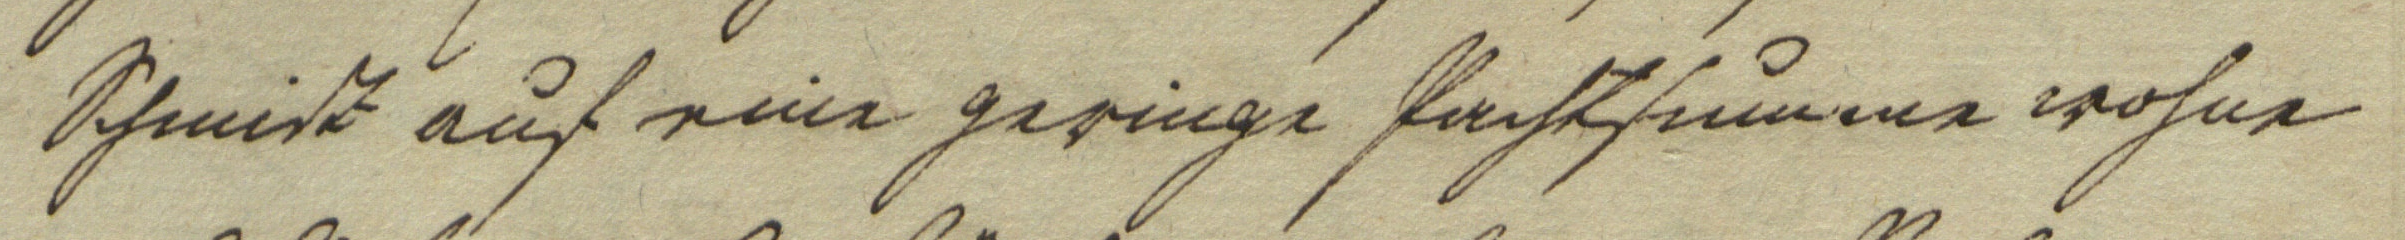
Schmidt auf eine geringe Pachtsumme wohne
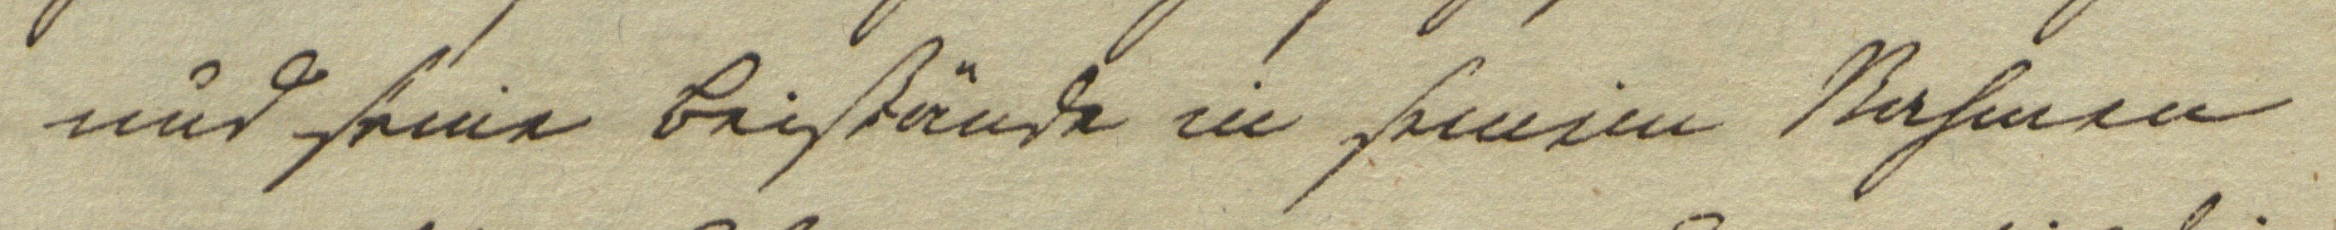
und seine Beistände in seinem Nahmen
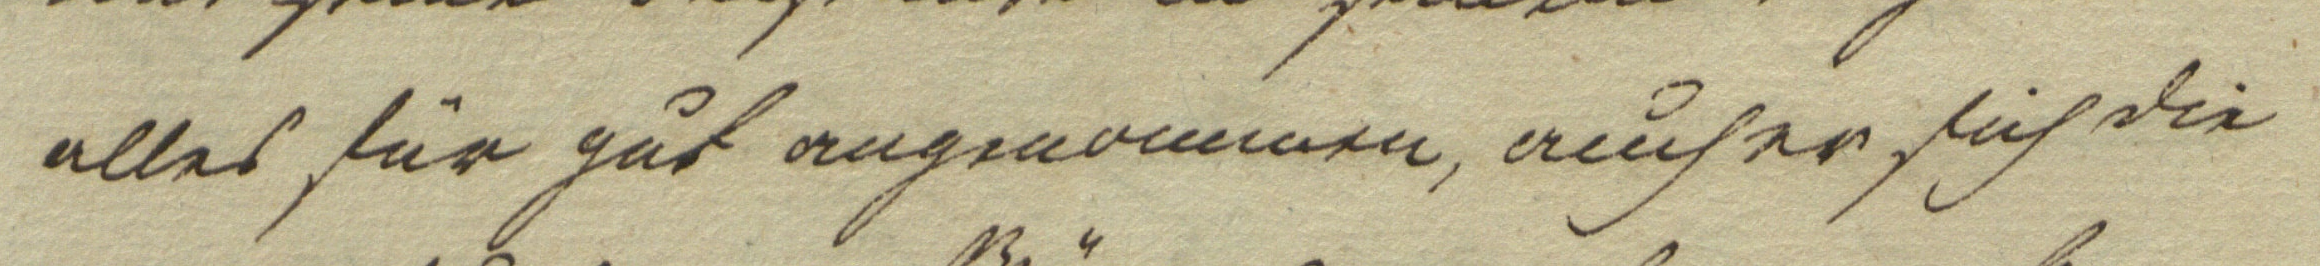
alles für gut angenommen, auch er sich die
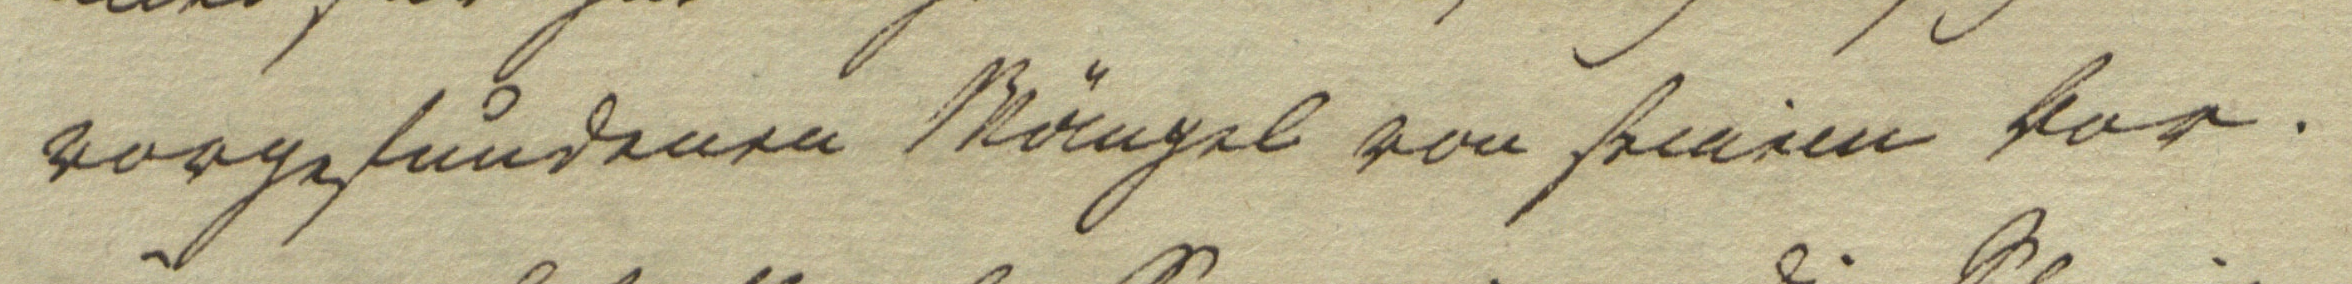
vorgefundenen Mängel von seinem Vor¬
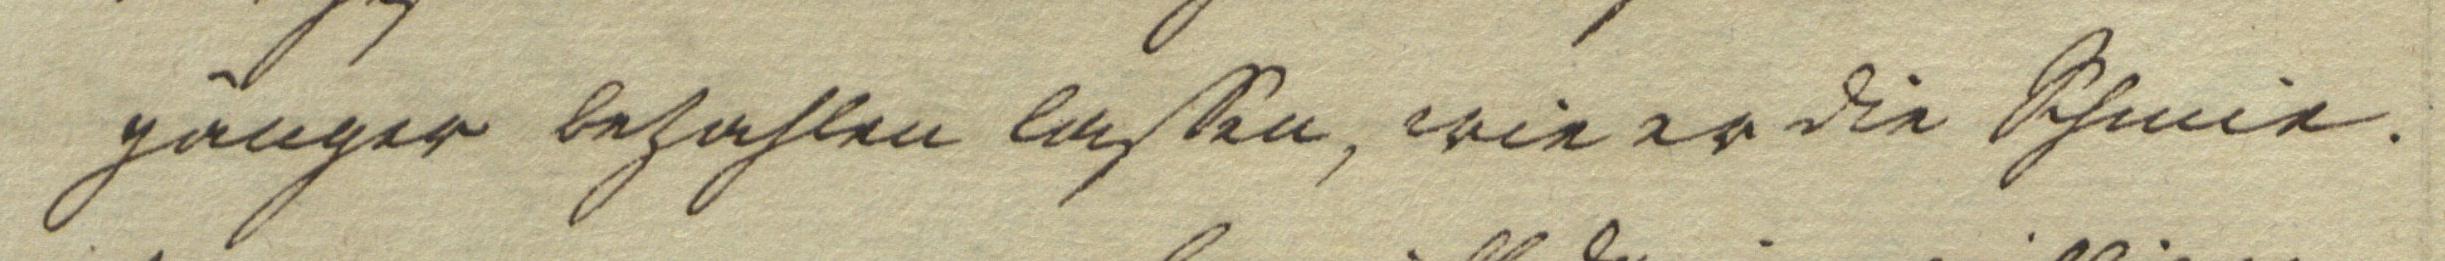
gänger bezahlen lassen, wie er die Schmie¬
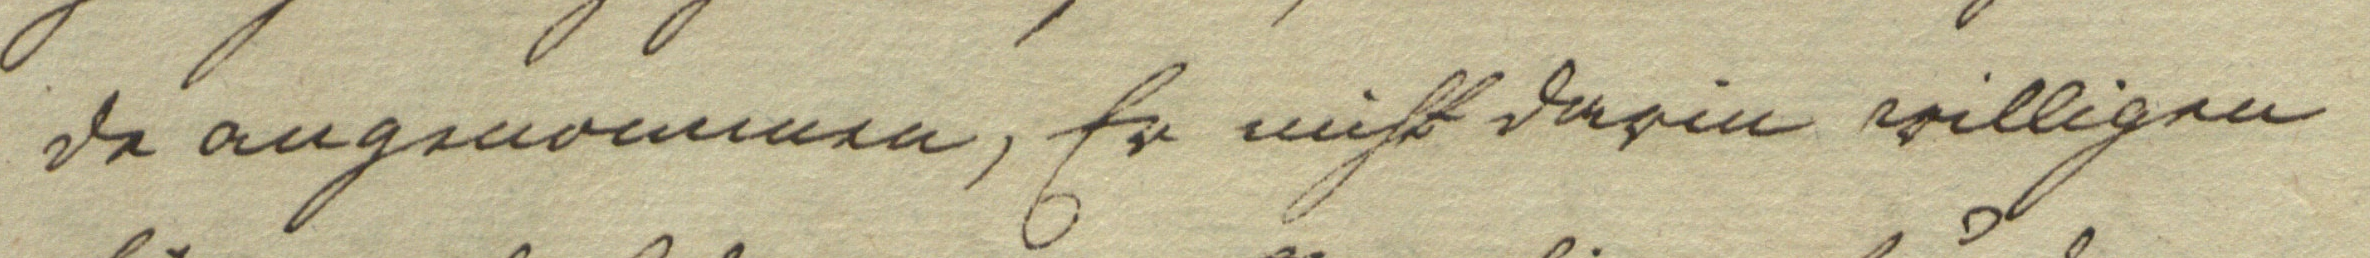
de angenommen, Er nicht darin willigen
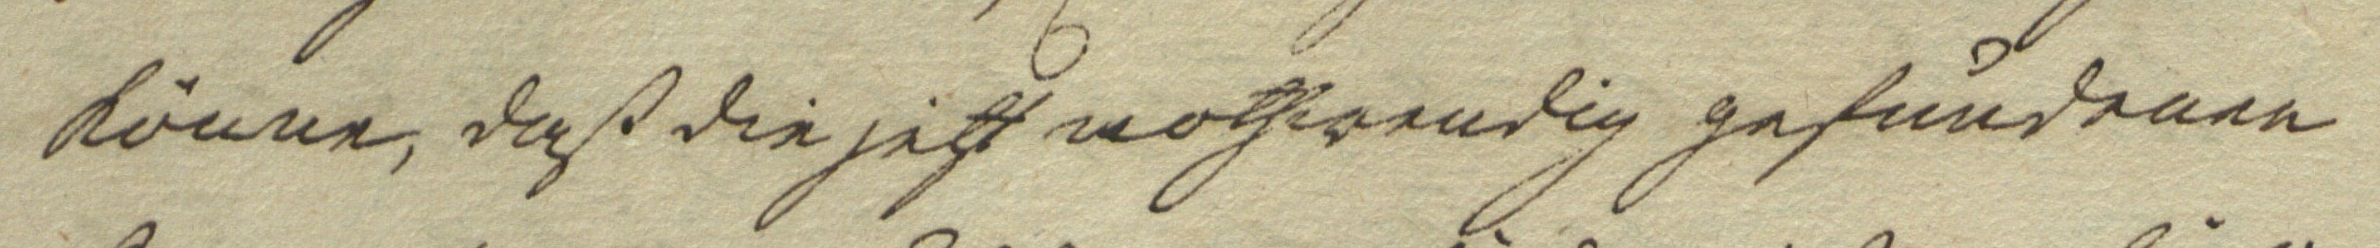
könne, daß die jetzt nothwendig gefundenen
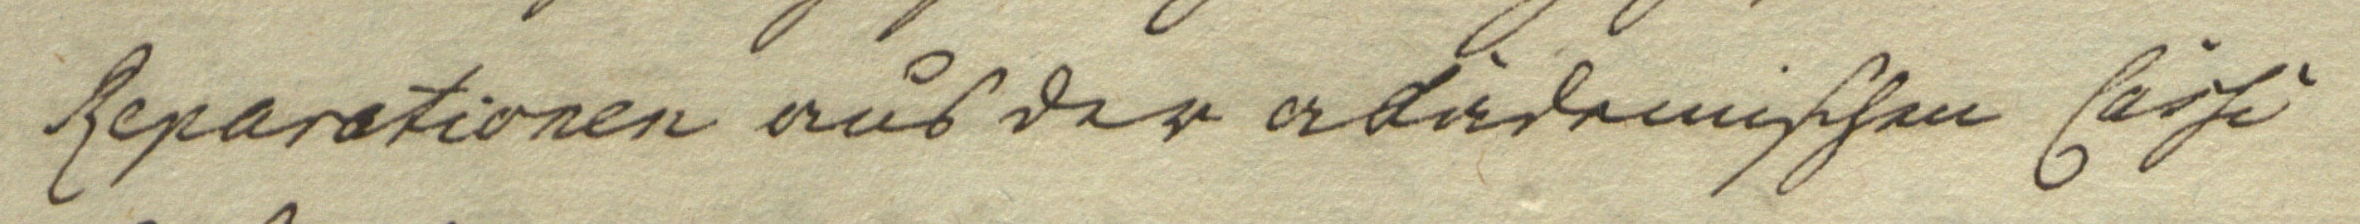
Reparationen aus der akademischen Casse
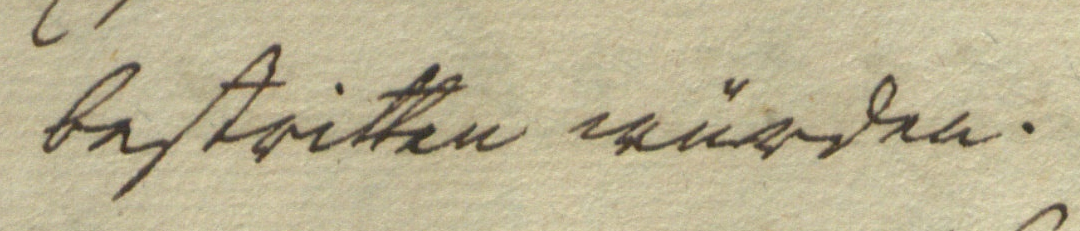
bestritten würden.
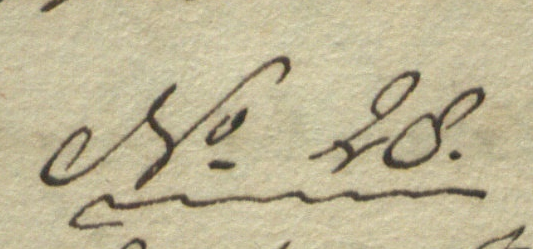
No 28..
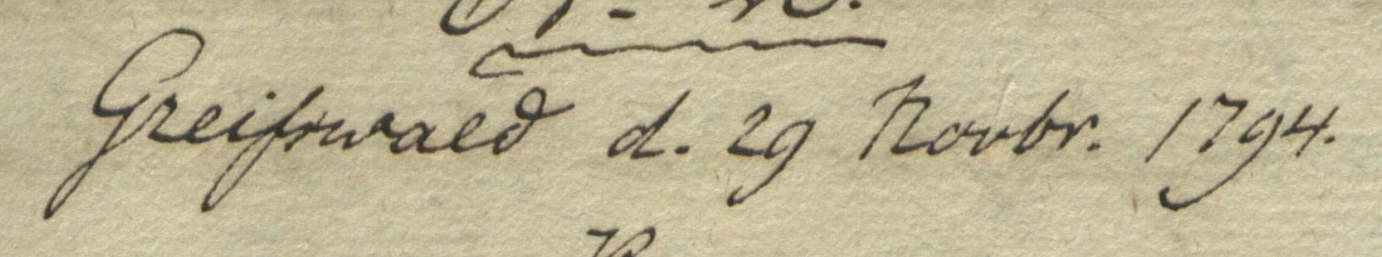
Greifswald d. 29 Novbr. 1794.
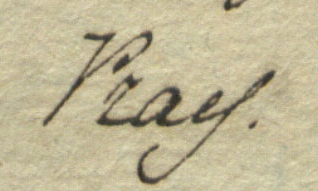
Praes.
